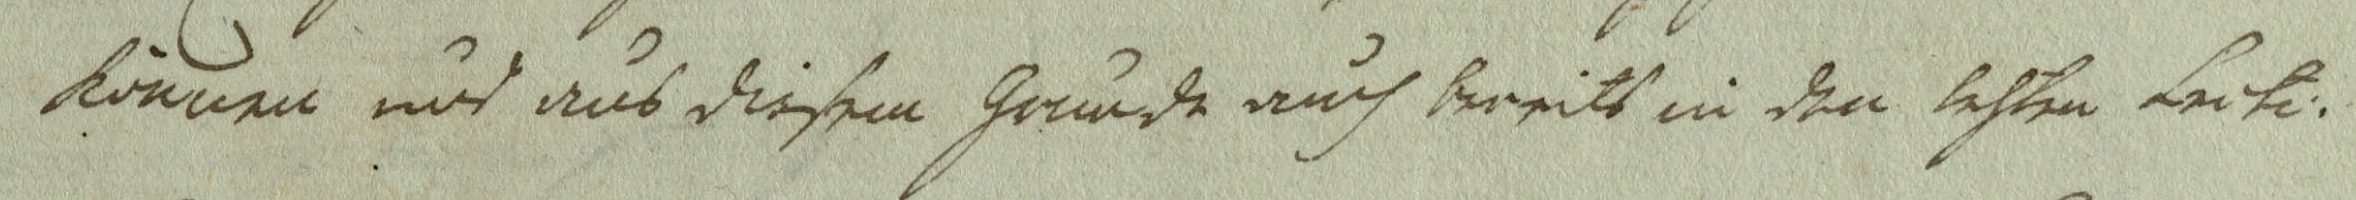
können und aus diesem Grunde auch bereits in den letzten Lecti¬
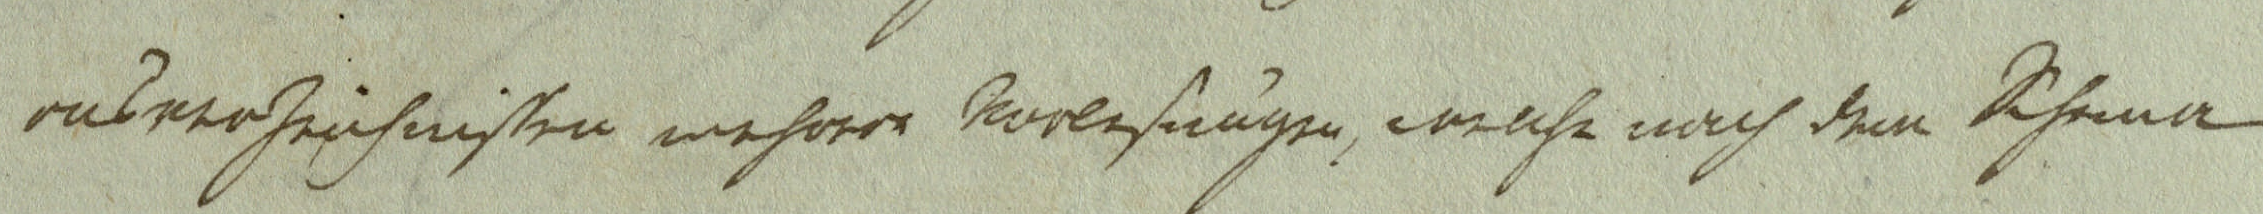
onsverzeichnissen mehrere Vorlesungen, welche nach dem Schema
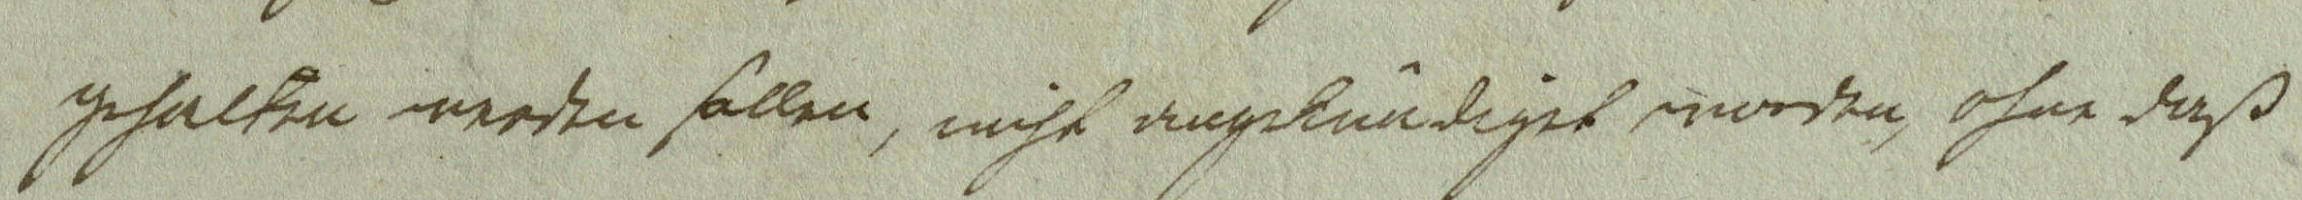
gehalten werden sollen, nicht angekündiget worden, ohne daß
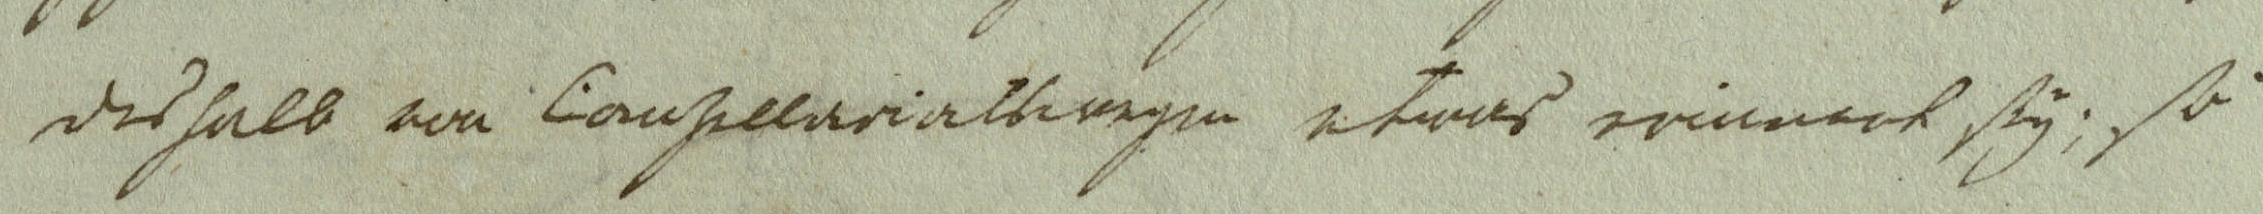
deshalb von Canzellariatswegen etwas erinnert seÿ; so
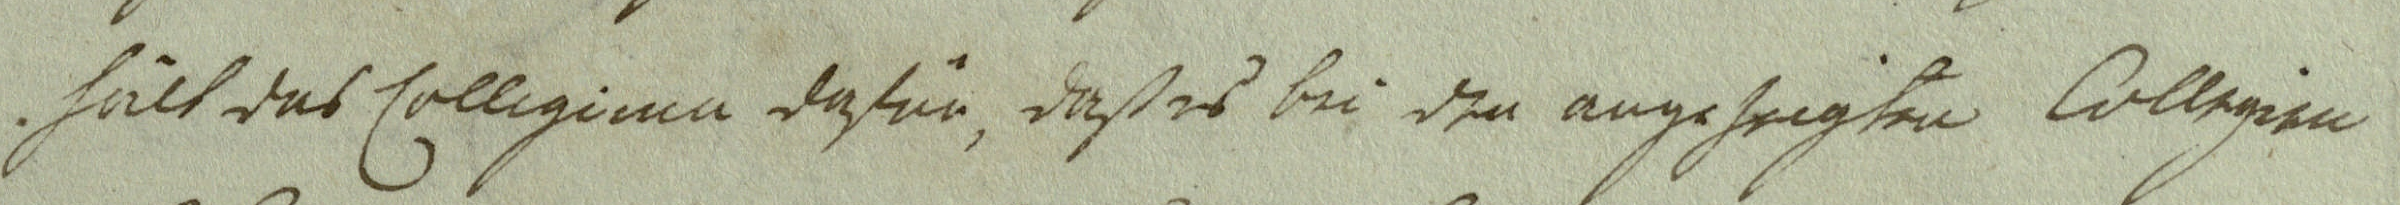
hält das Collegim dafür, daß es bei den angezeigten Collegien
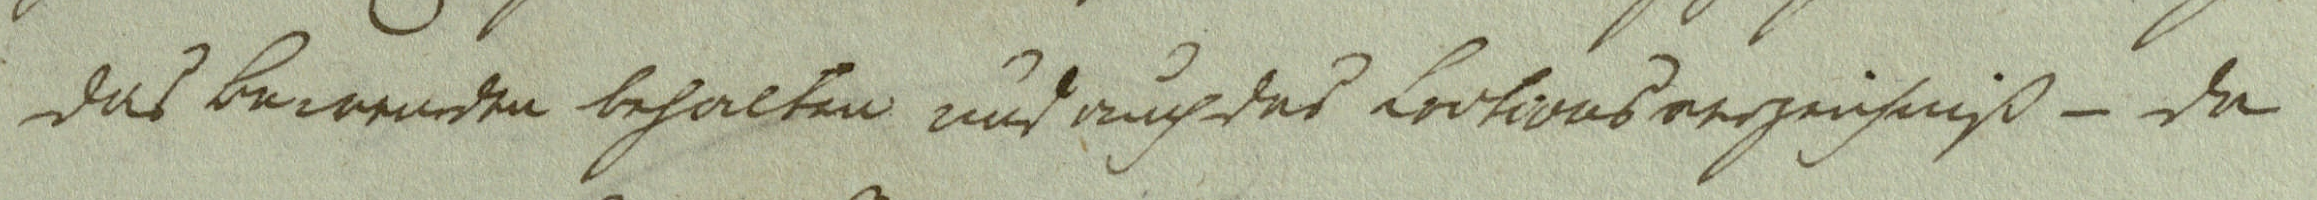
das Bewenden behalten und auch das Lectionsverzeichniß - da
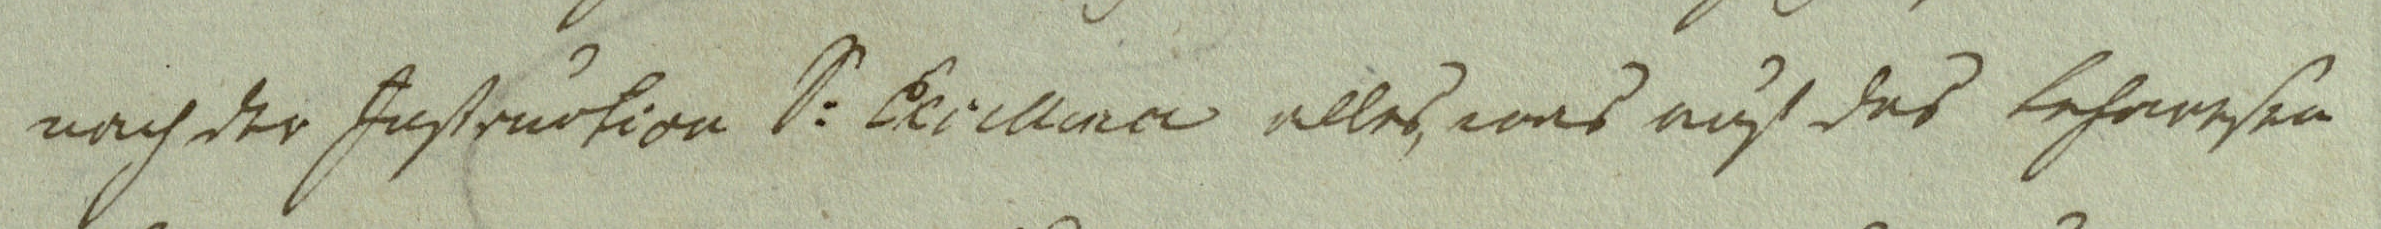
nach der Instruction Sr. Excellence alles, was auf das lehrwesen
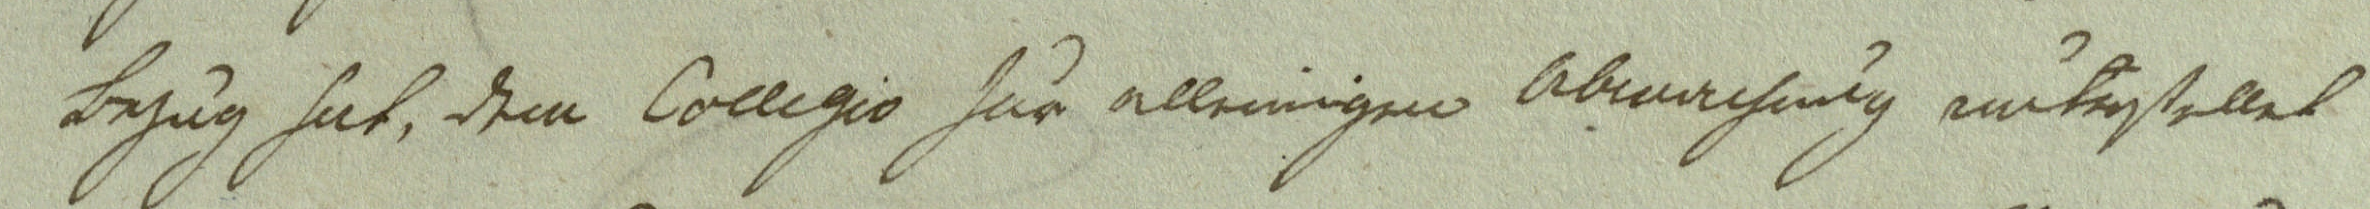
Bezug hat, dem Collegio zur alleinigen Abmachung unterstellet
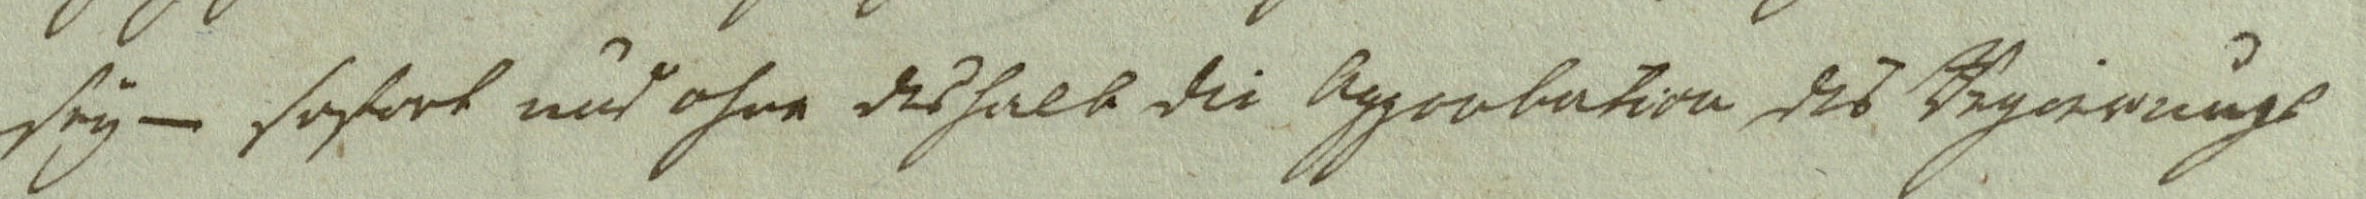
seÿ - sofort und ohne deshalb die Approbation des Regierungs
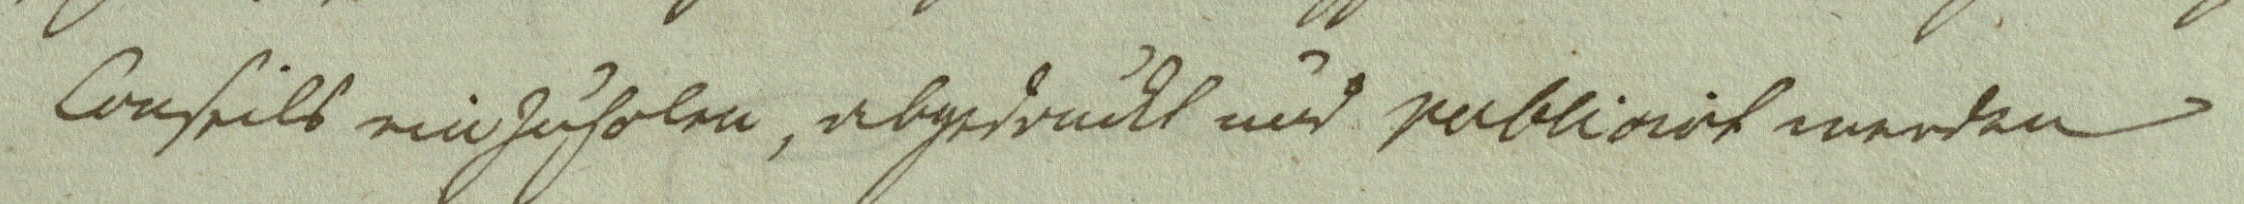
Conseils einzuholen, abgedruckt und publicirt werden
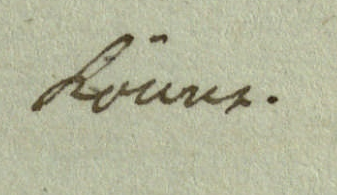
könne.
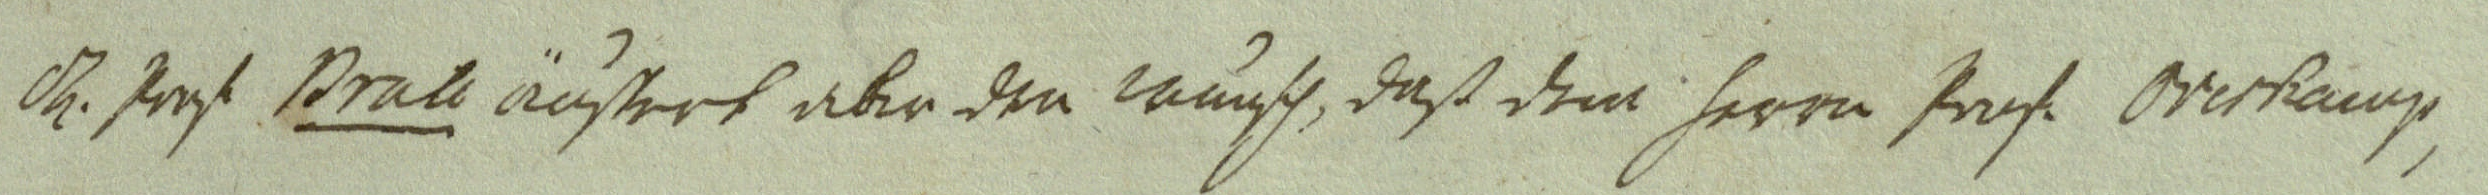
dh. Prof. Bratt äußert aber den Wunsch, daß dem herrn Prof. Overkamp,
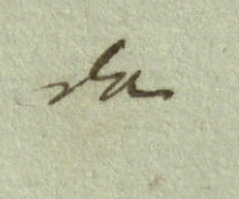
da
